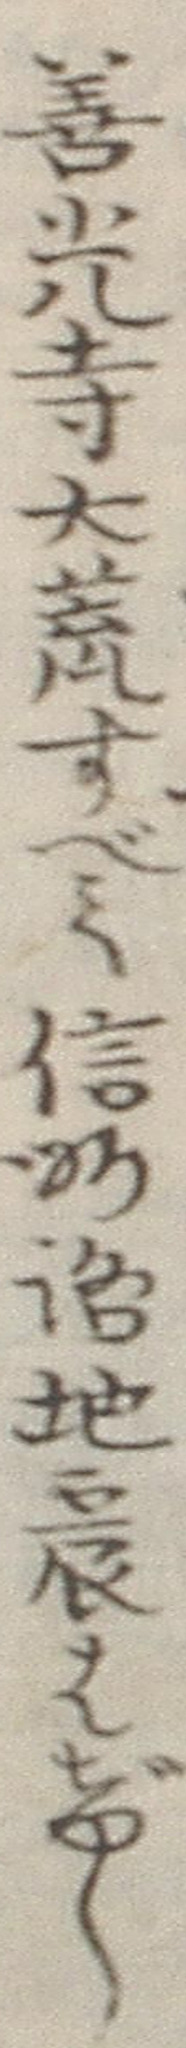善光寺大荒すべて信州路地震はげし
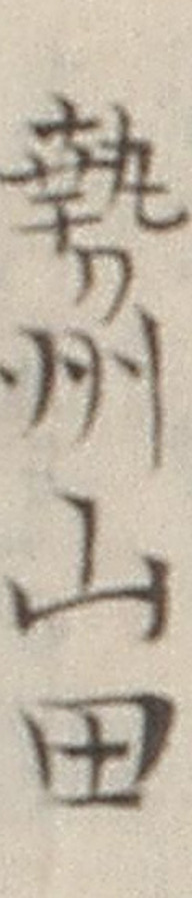勢州山田
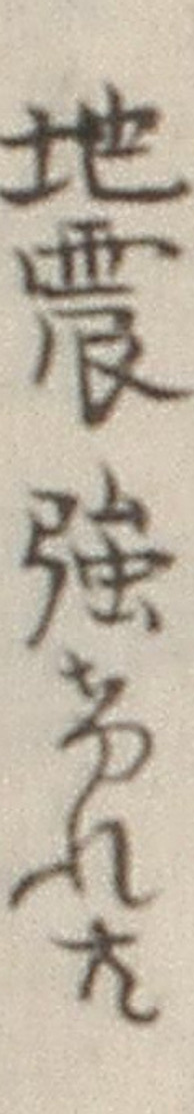地震強けれ共
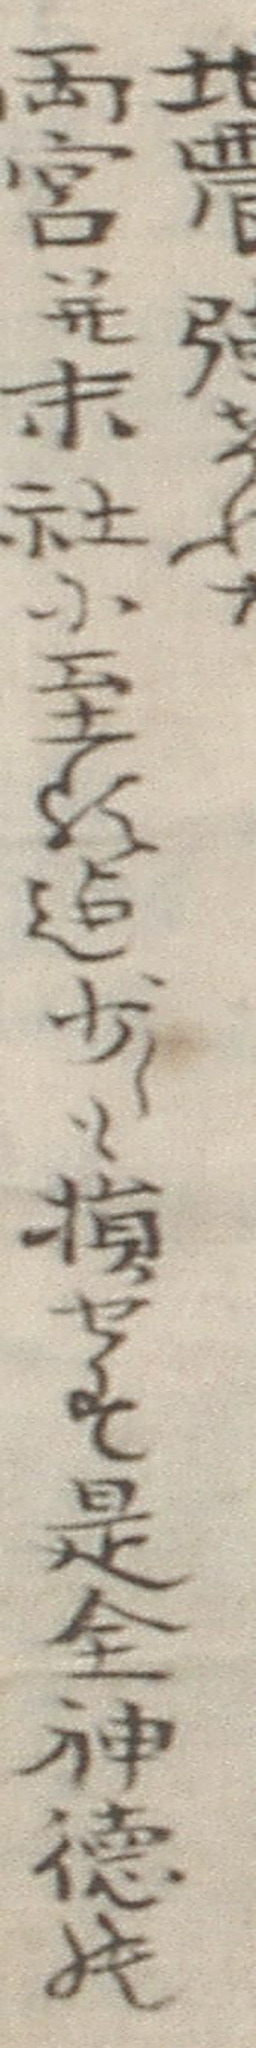両宮并末社に至新る迠少しも損せす是全神徳の
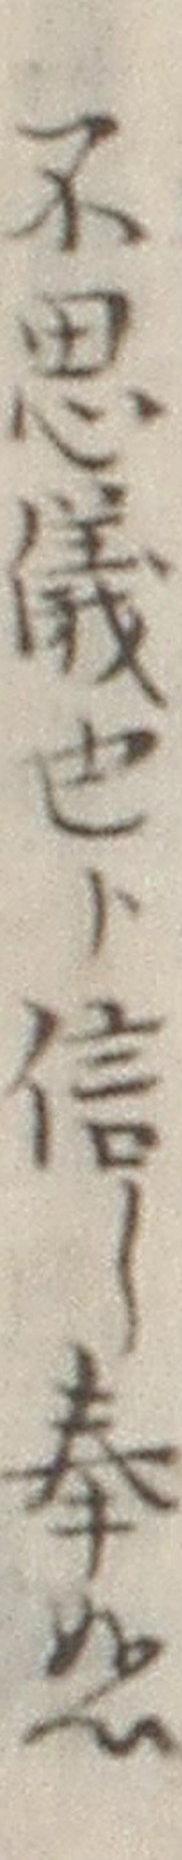不思儀也と信し奉ぬ
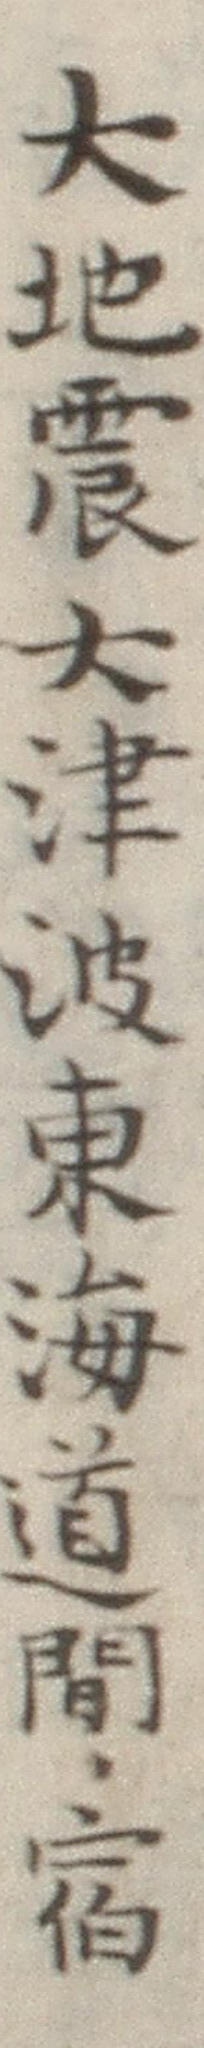大地震大津波東海道間ノ宿
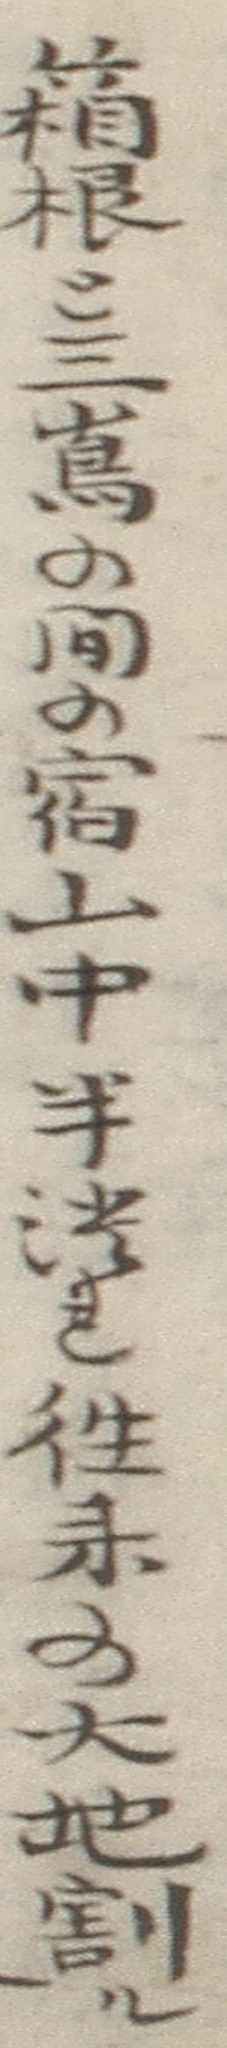箱根と三嶌の間の宿山中半潰れ往来の大地割る
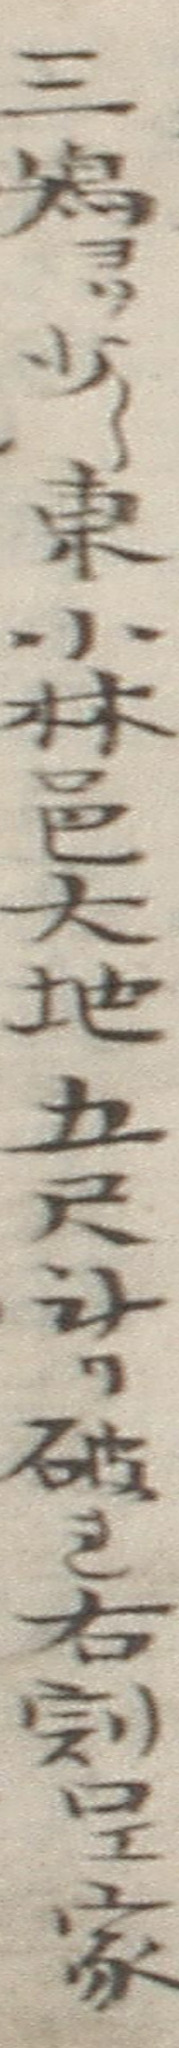三嶋より少し東小林邑大地五尺計り破れ右割口エ家
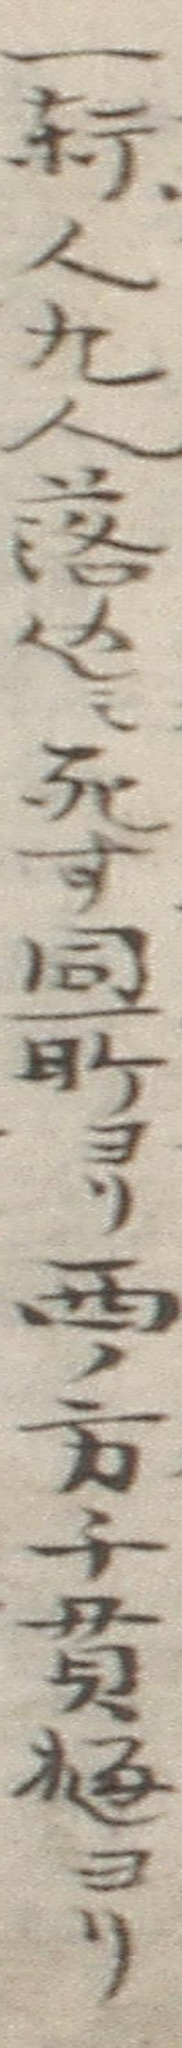一軒人九人落込み死す同所より西の方千貫樋より
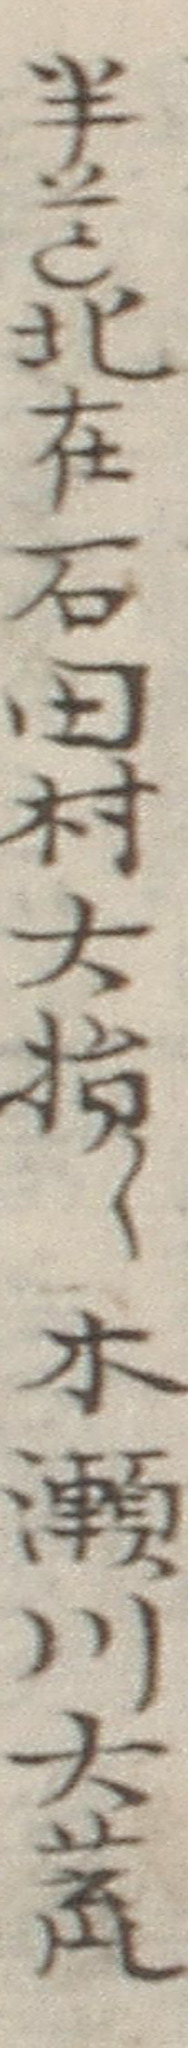半道北在石田村大損し木瀬川大荒
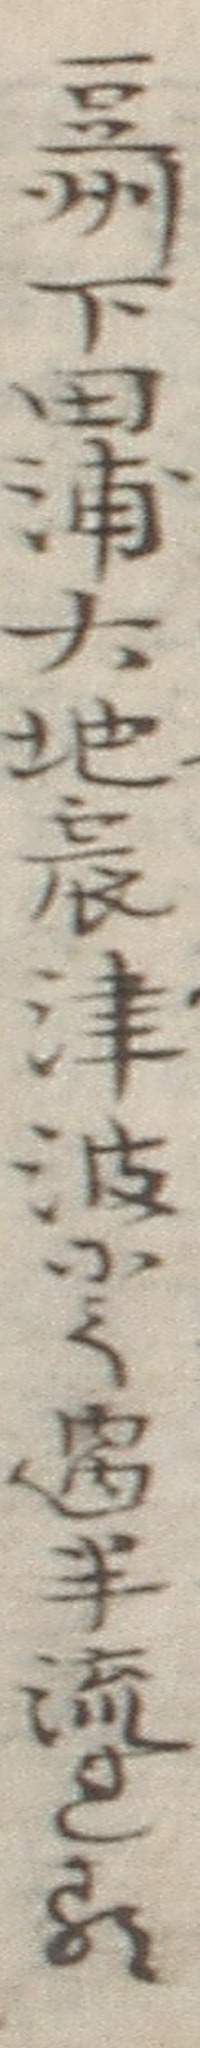豆州下田浦大地震津波にて過半流れる
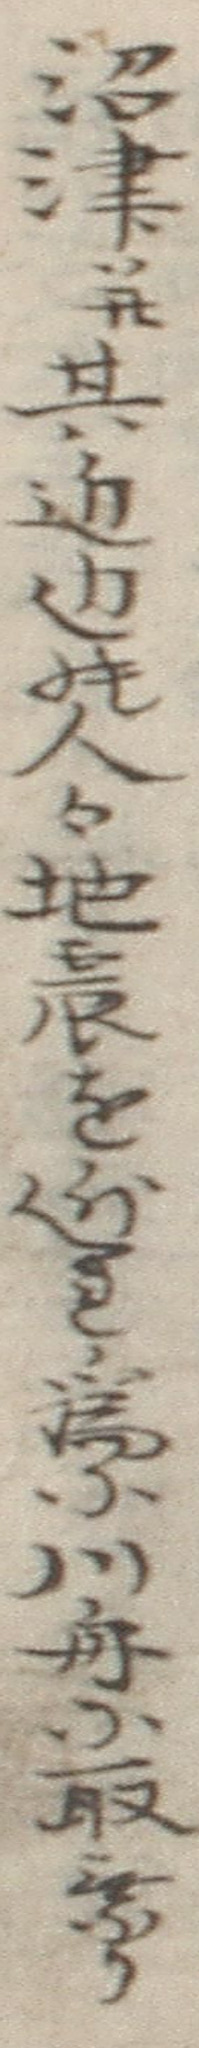沼津并其近辺の人々地震を逃れノ爲に川舟に取乗り

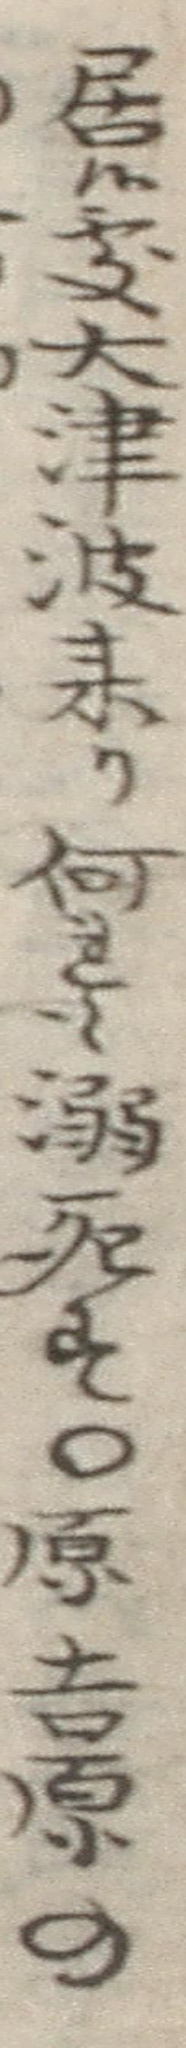居候處大津波来り何れも溺死す○原吉原の
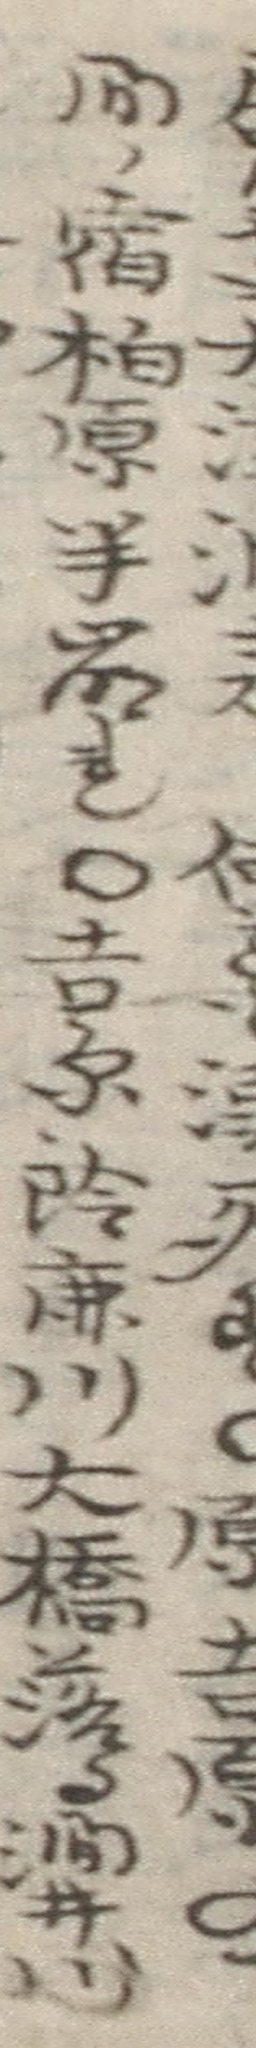間ノ宿柏原半崩れ○吉原鈴鹿川大橋落る潤井川
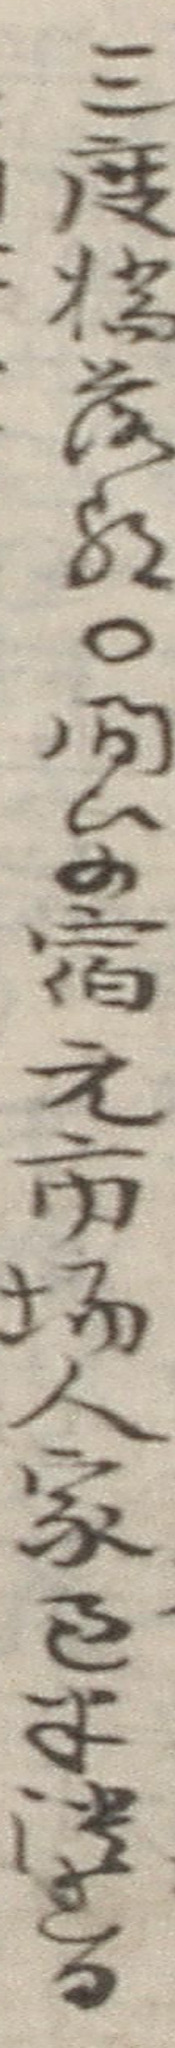三度橋落る○間ひの宿元市場人家過半潰れる
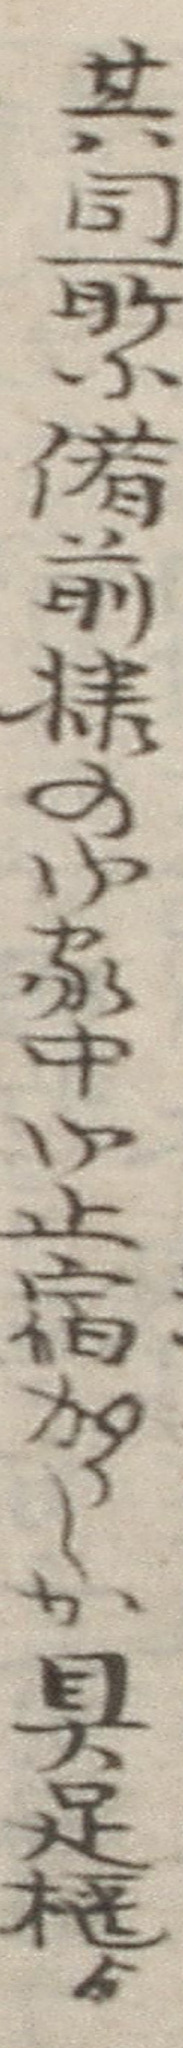其同所に備前様の御家中御止宿成りしか具足櫃ゟ
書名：諸國大地震年代記末代噺種
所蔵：東京大学地震研究所図書室 Earthquake Research Institute Library, The University of Tokyo, JAPAN
